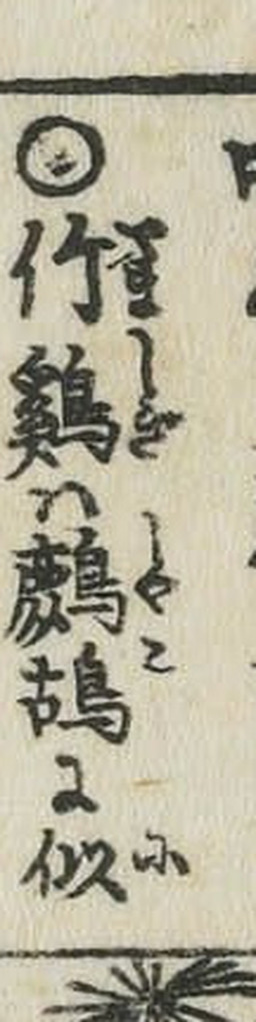○竹鶏は鷓鴣に似
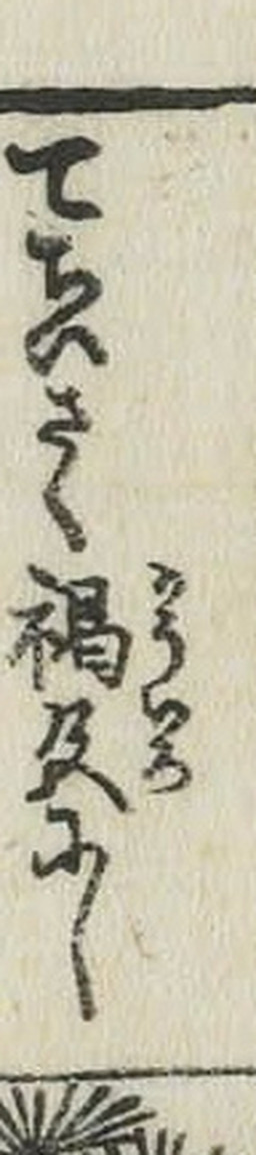てちいさく褐色にし
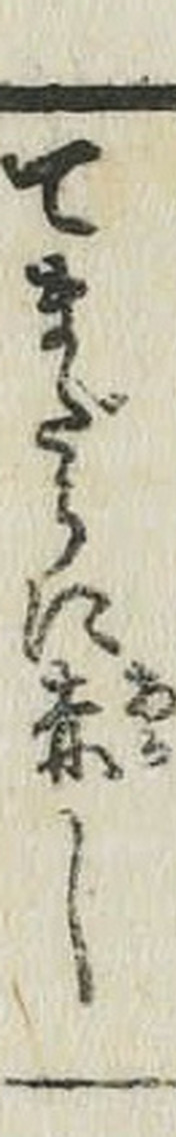てまだらに赤し
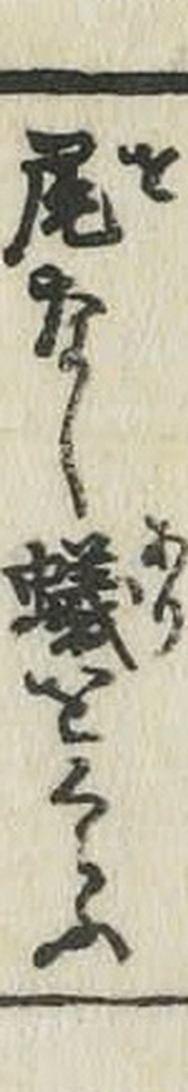尾なし蟻をくらふ
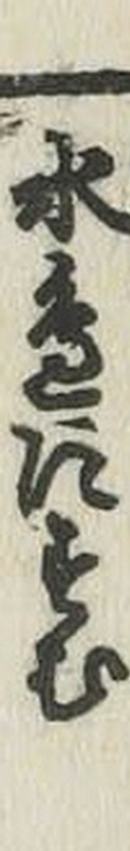水辺にすむ
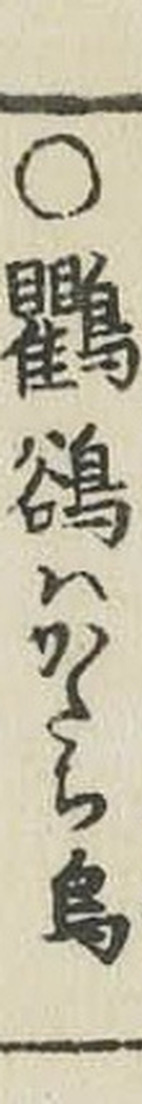○鸜鵒はかたち烏
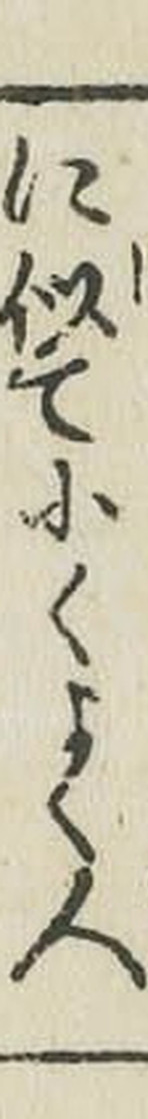に似て小くよく人
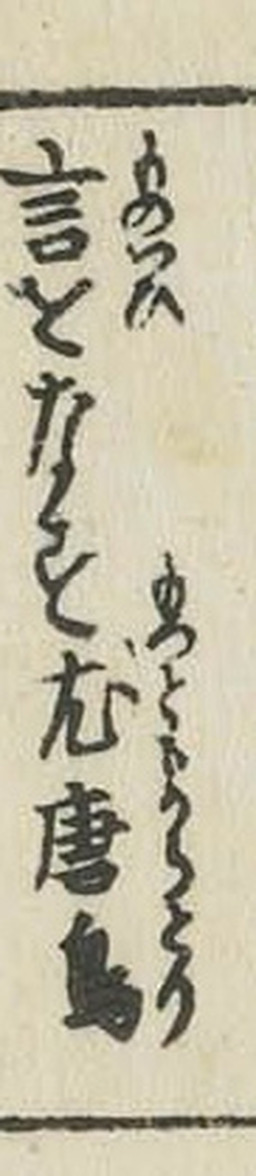言をなす尤唐鳥
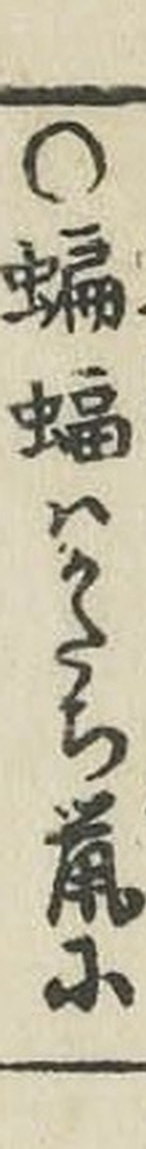○蝙蝠はかたち鼠に
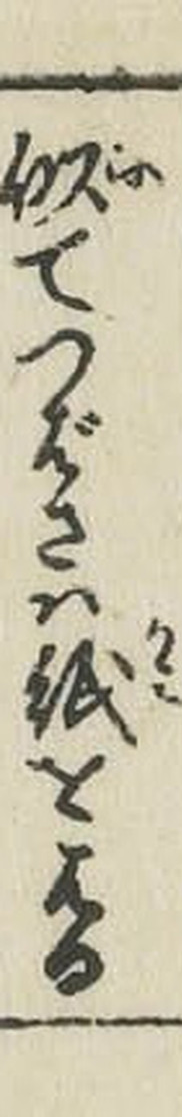似てつばさは紙をはる
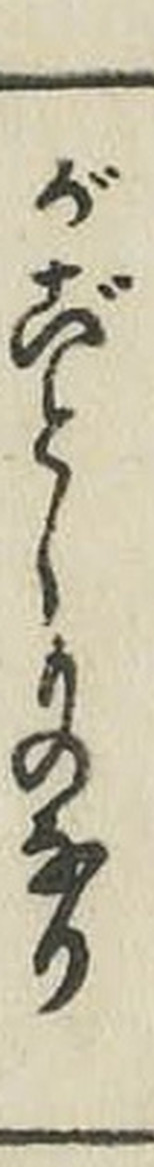がごとしものなり
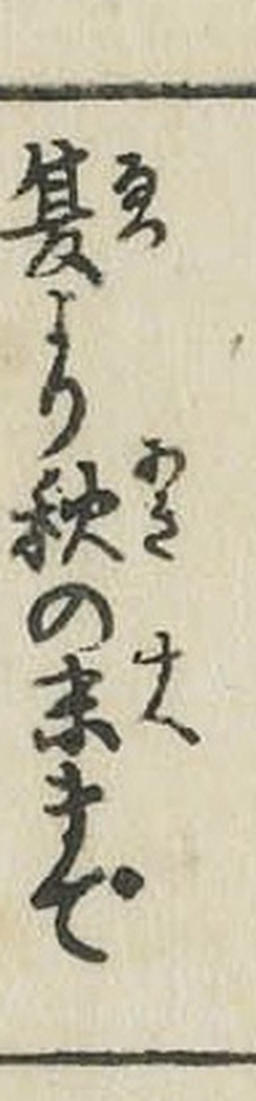夏より秋の末まで
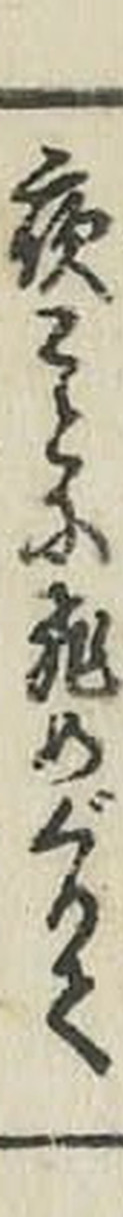夜ことに飛めぐりて
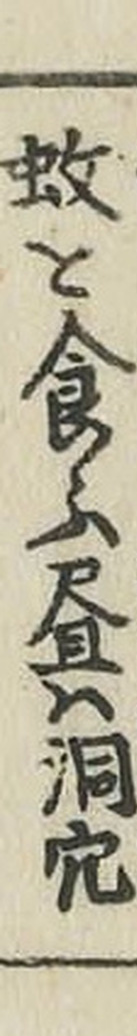蚊を食ふ昼は洞穴
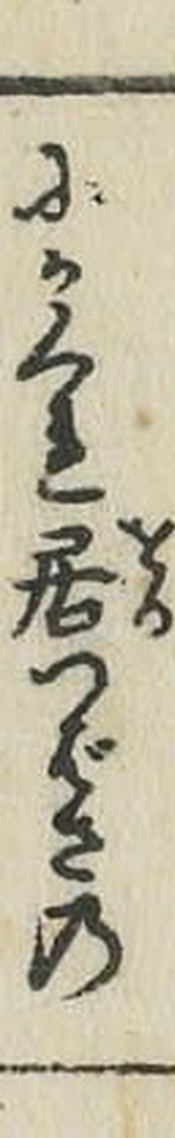にかくれ居つばさの

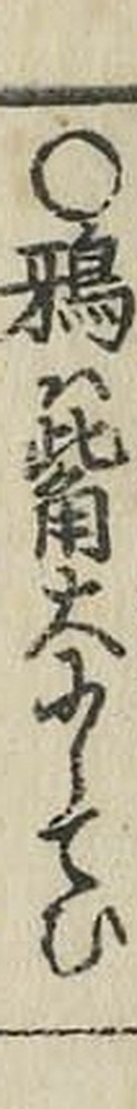○鴉は觜大にしてむ
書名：増補頭書訓蒙図彙大成 10巻 6:巻之12-13
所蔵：東京学芸大学教育コンテンツアーカイブ
